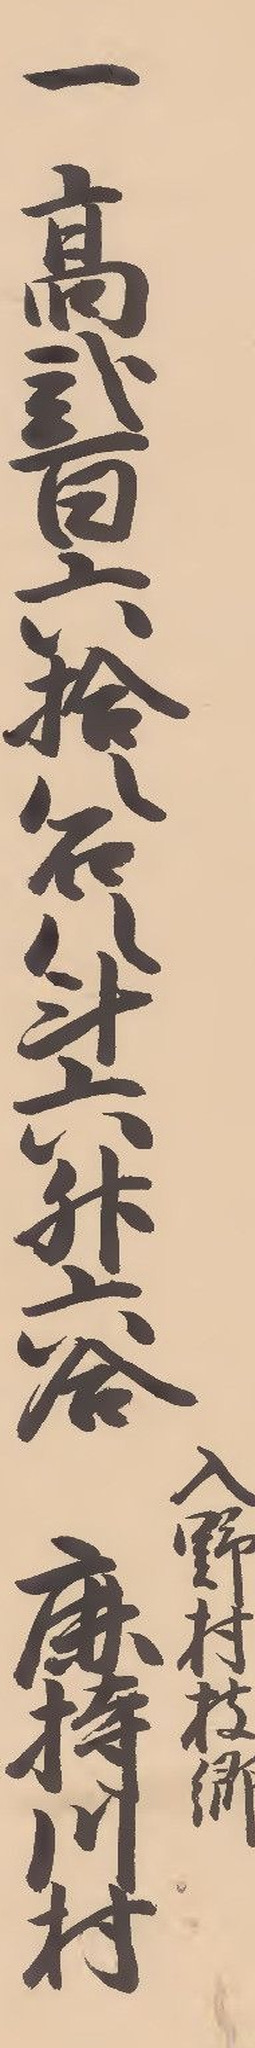一髙弐百六拾八石八斗六升六合鹿持川村
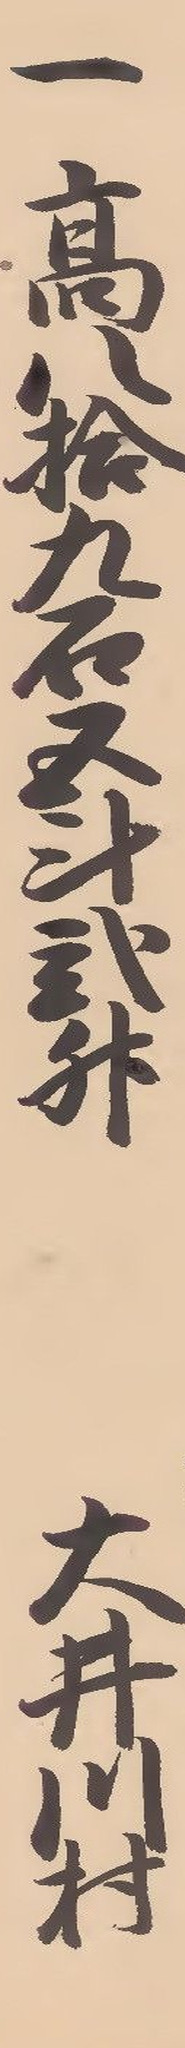一髙八拾九石五斗弐升大井川村

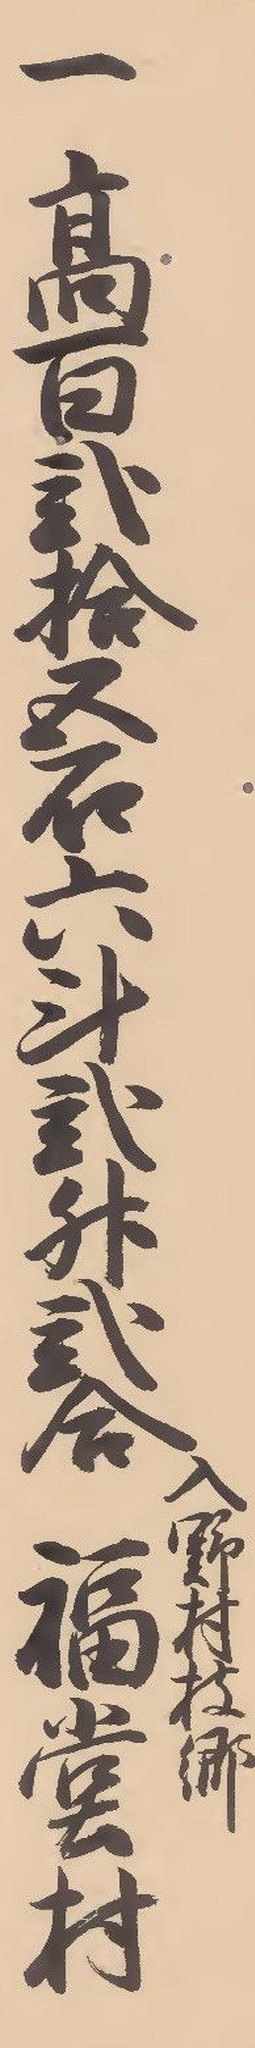一髙百弐拾五石六斗弐升弐合福堂村
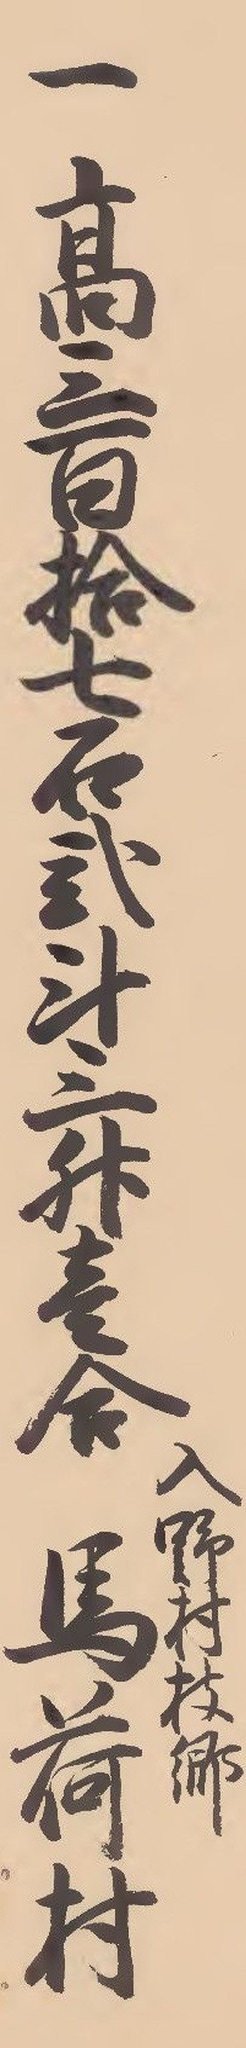一髙三百拾七石弐斗三升壱合馬荷村
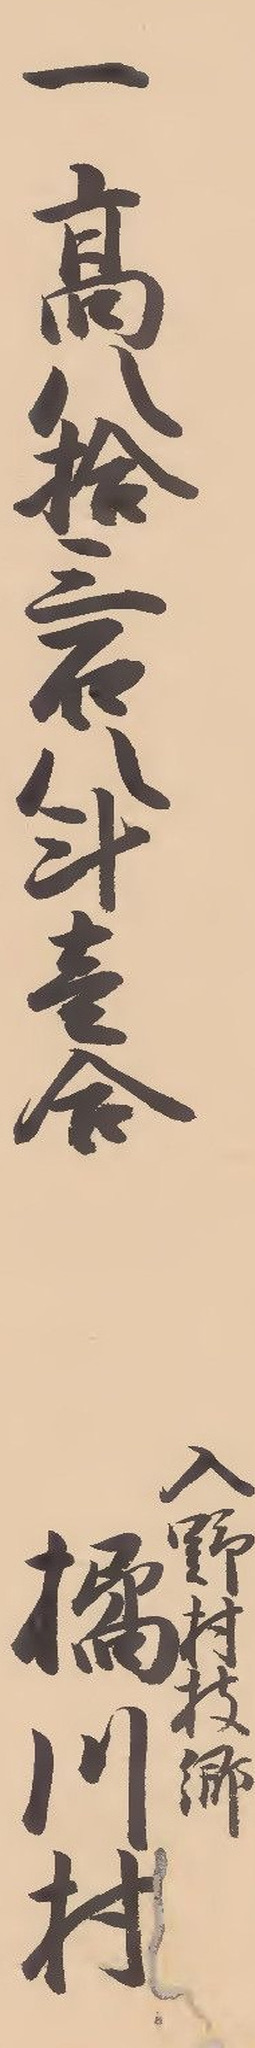一髙八拾三石八斗壱合橘川村
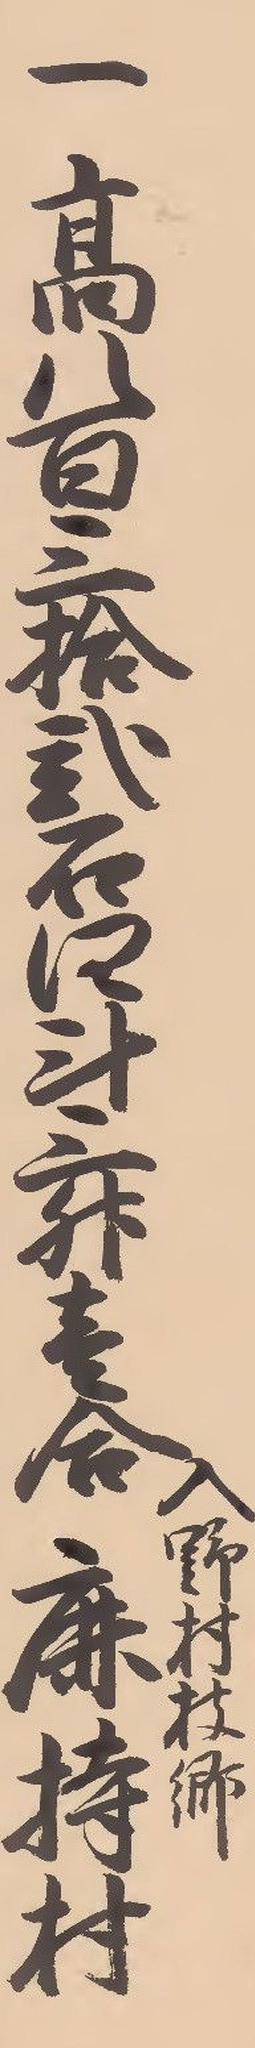一髙八百三拾弐石四斗三升壱合鹿持村
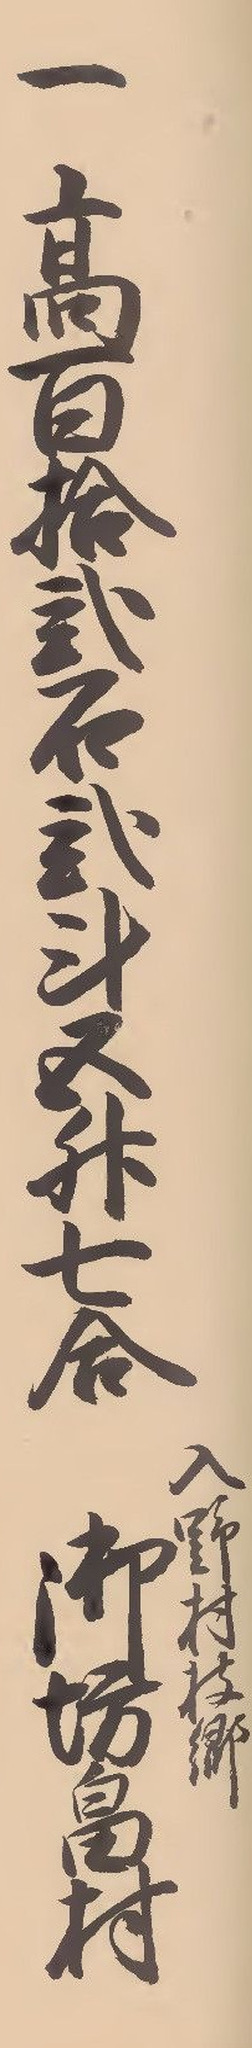一髙百拾弐石弐斗五升七合御坊畠村
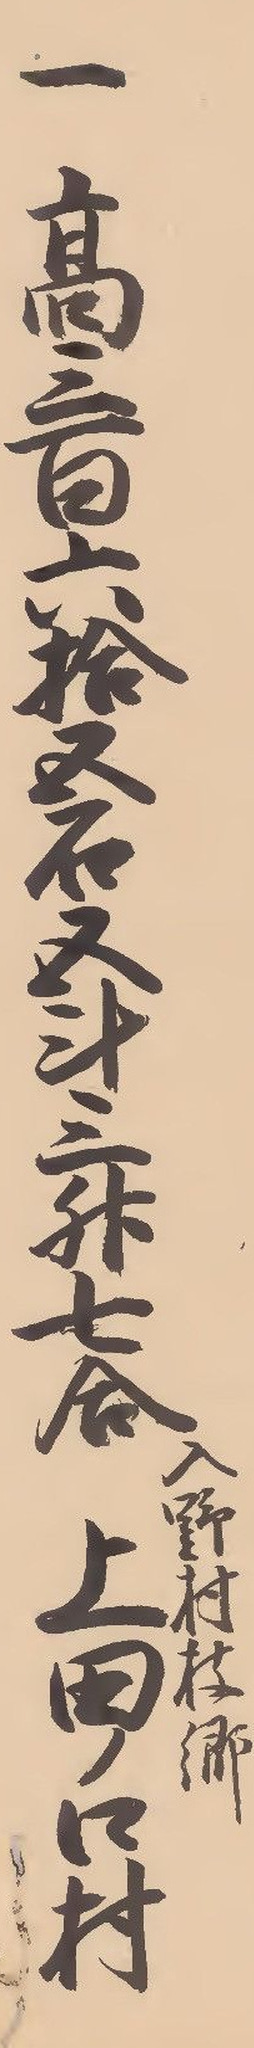一髙三百六拾五石五斗三升七合上田ノ口村
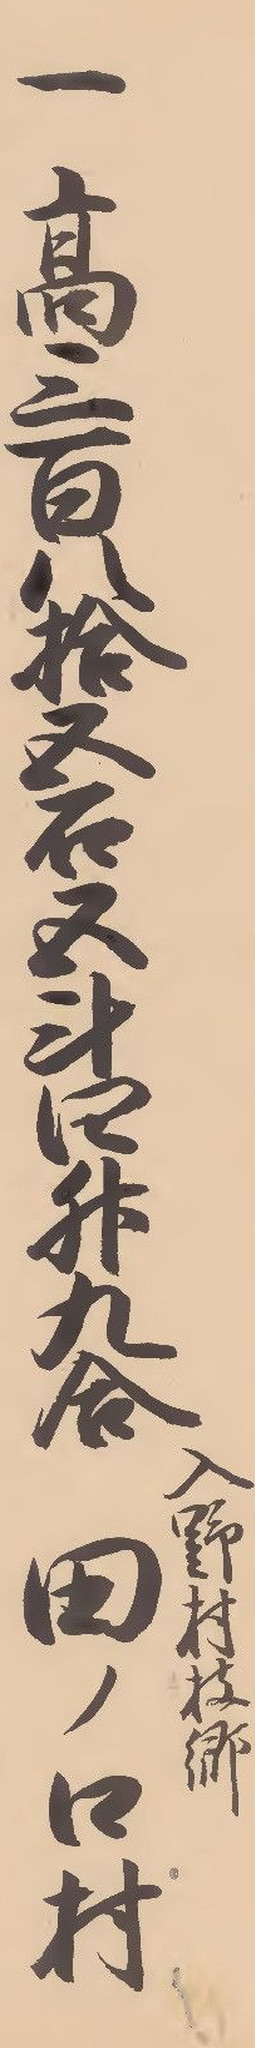一髙三百八拾五石五斗四升九合田ノ口村
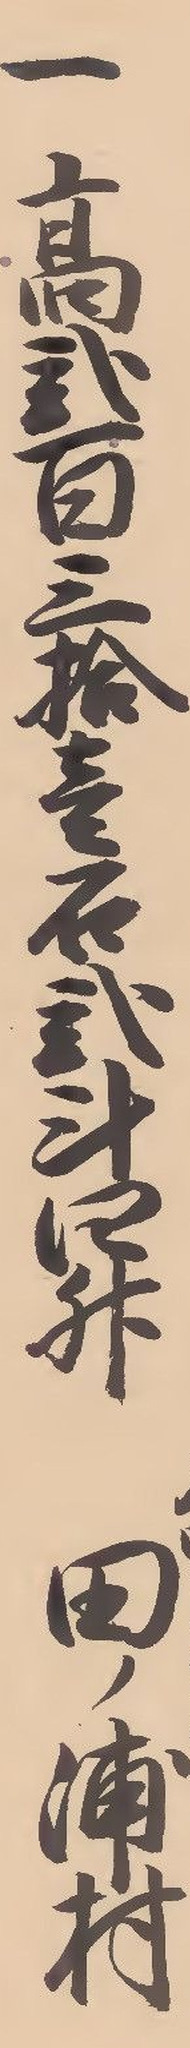一髙弐百三拾壱石弐斗四升田ノ浦村

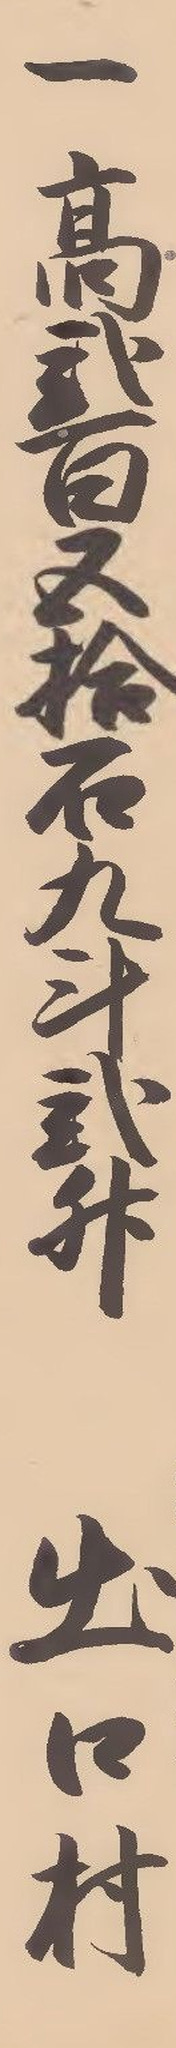一髙弐百五拾石九斗弐升出口村
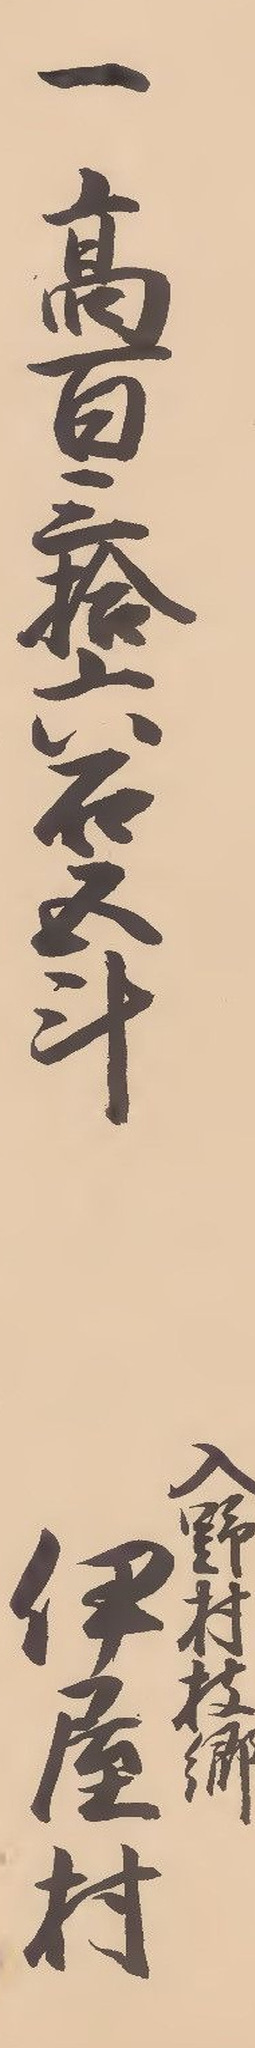一髙百三拾六石五斗伊屋村
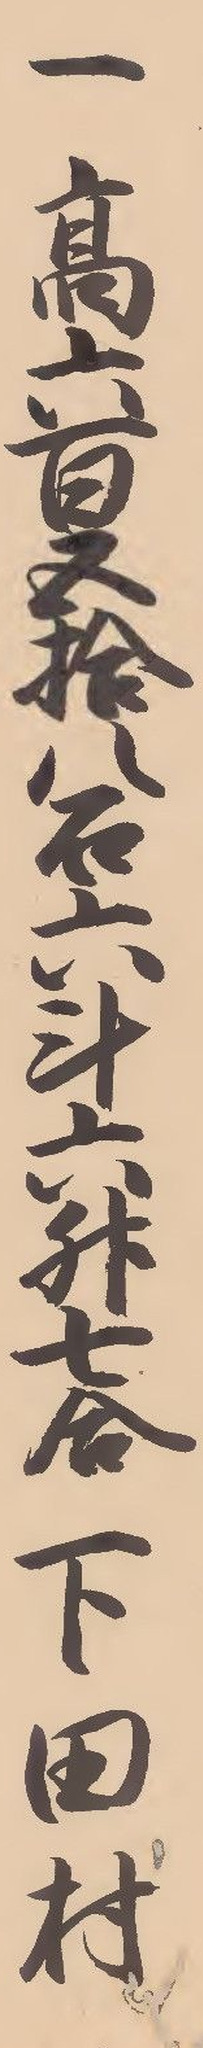一髙六百五拾八石六斗六升七合下田村
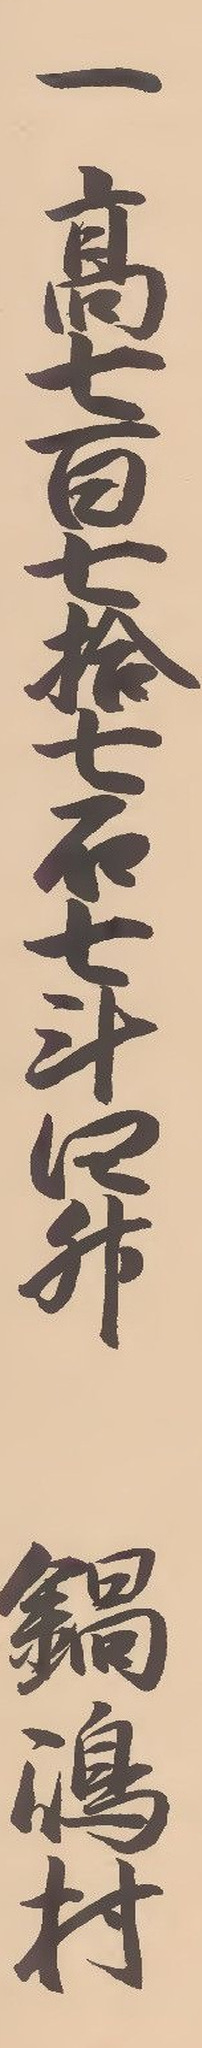一髙七百七拾七石七斗四升鍋嶋村
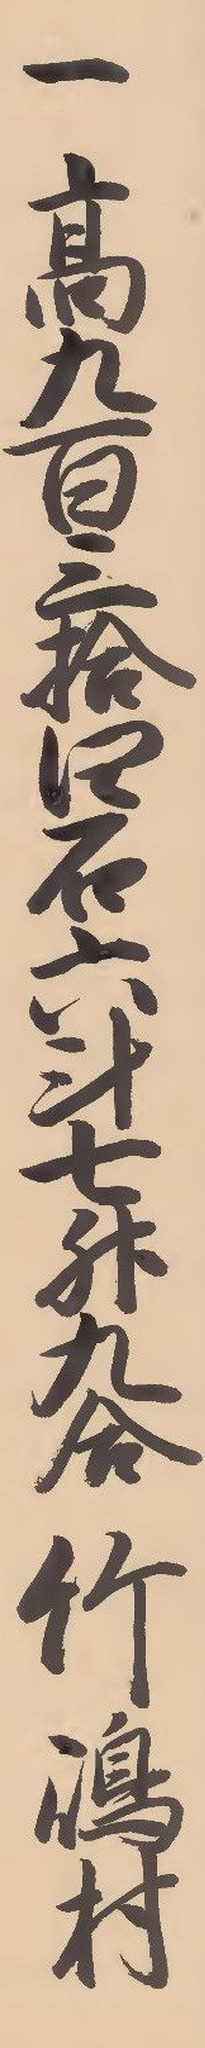一髙九百三拾四石六斗七升九合竹嶋村
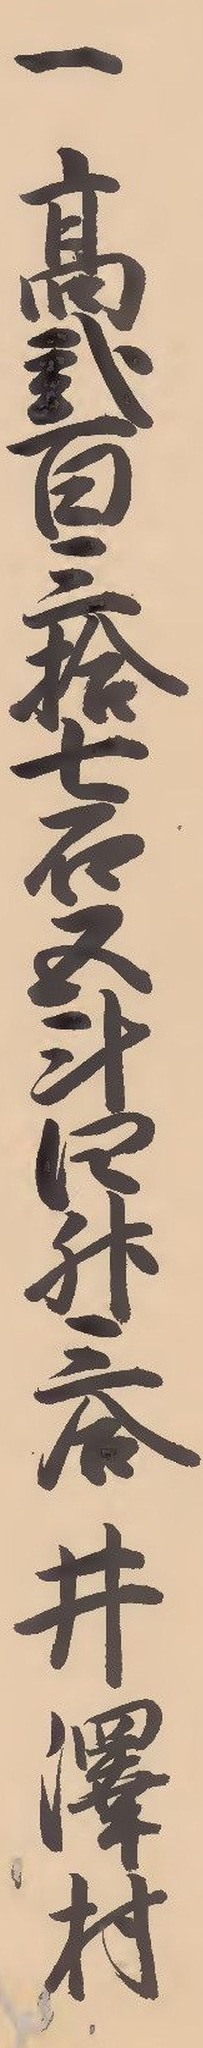一髙弐百三拾七石五斗四升三合井澤村
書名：土佐国郷帳
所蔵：国立公文書館 National Archives of Japan
